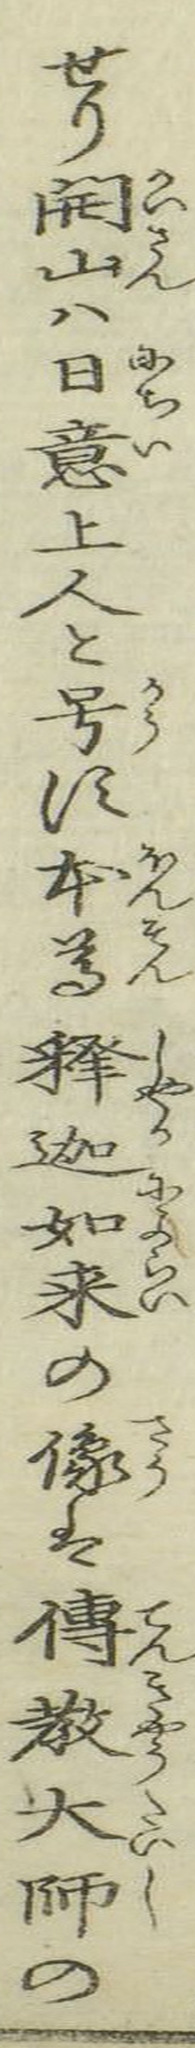せり開山は日意上人と号す本尊釈迦如来の像は伝教大師の

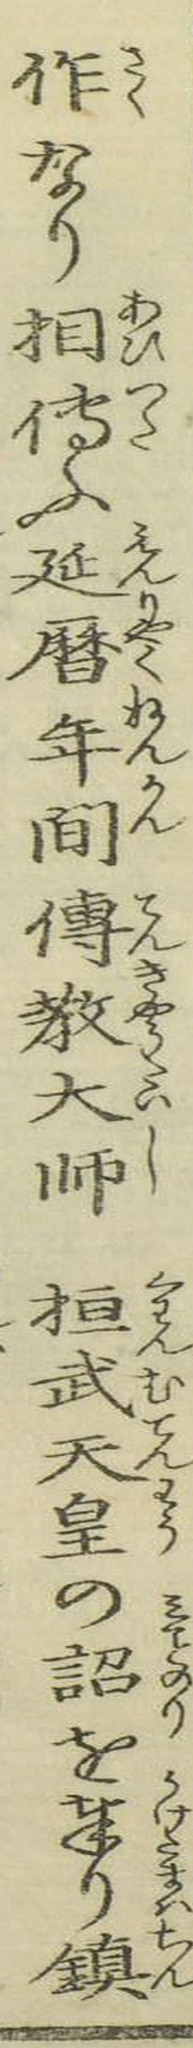作なり相伝ふ延暦年間伝教大師桓武天皇の詔を承り鎮
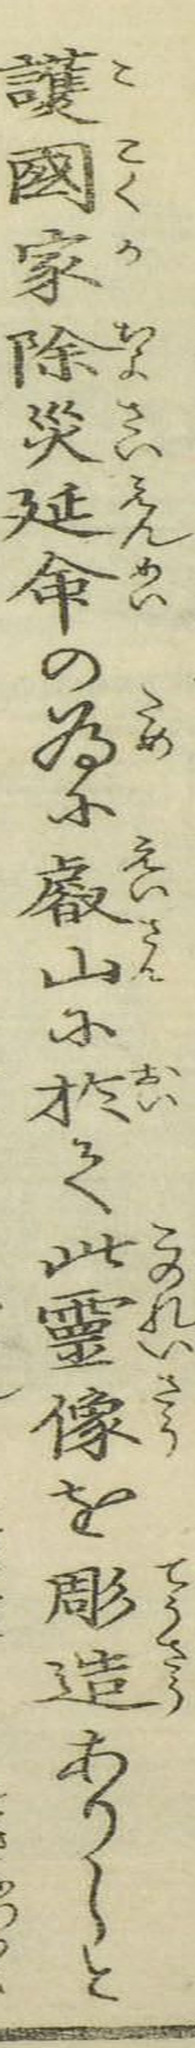護国家除災延命の為に叡山に於て此霊像を彫造ありしと
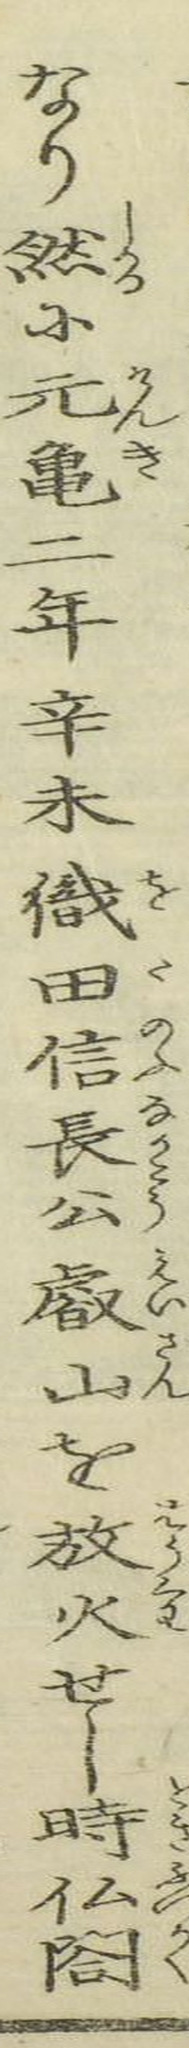なり然に元亀二年辛未織田信長公叡山を放火せし時仏閣
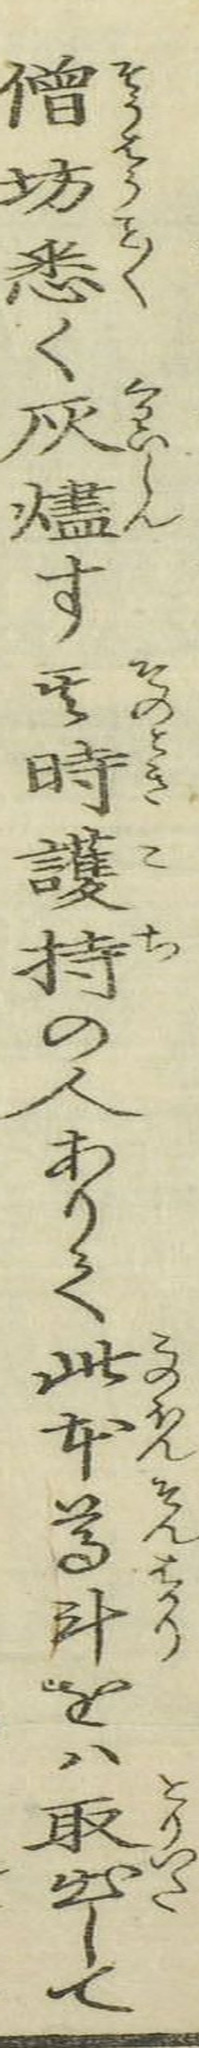僧坊悉く灰燼す其時護持の人ありて此本尊計をは取出して
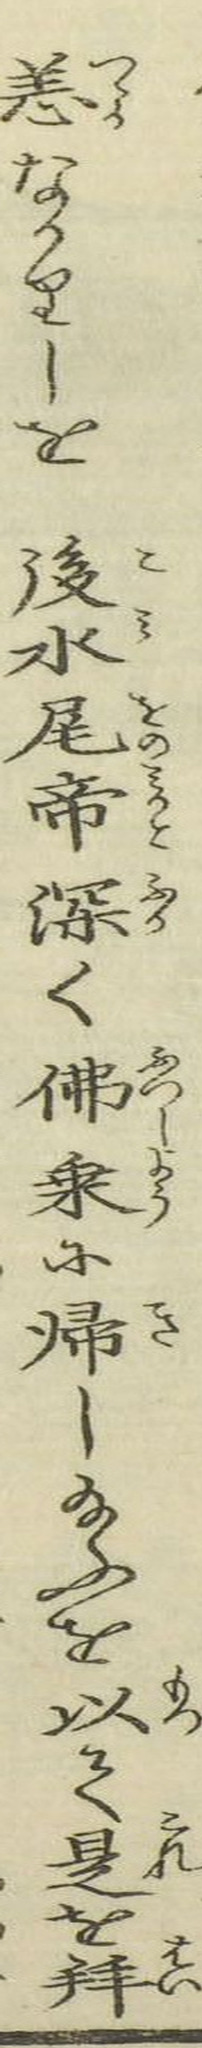恙なかりしを後水尾帝深く仏乗に帰し給ふを以て是を拝
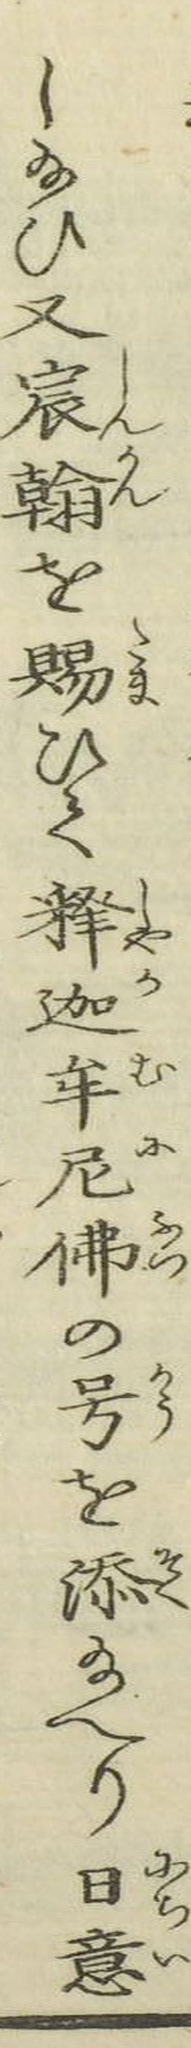し給ひ又宸翰を賜ひて釈迦牟尼仏の号を添給へり日意
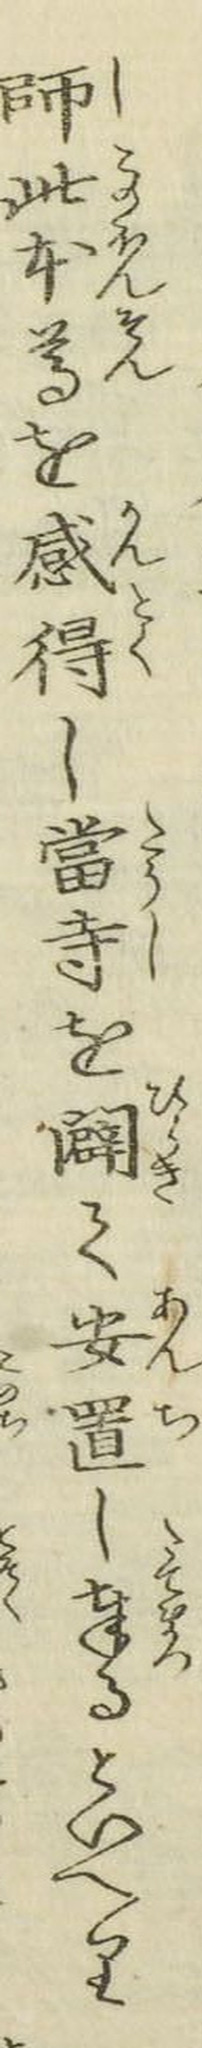師此本尊を感得し当寺を闢て安置し奉るといへり
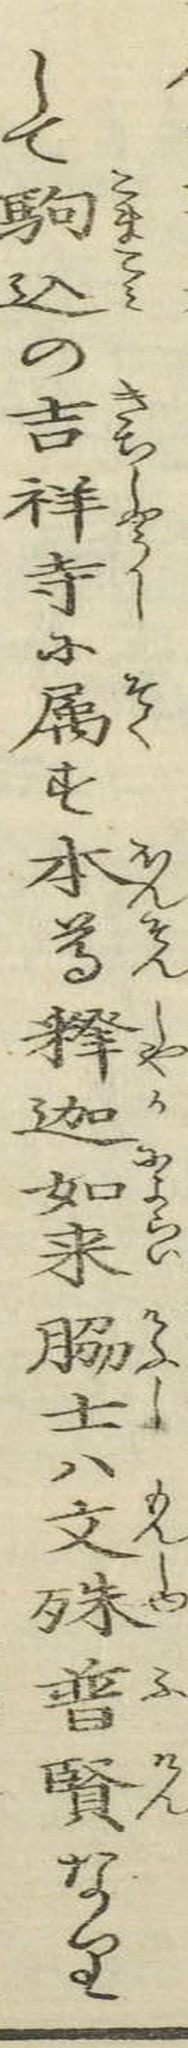して駒込の吉祥寺に属す本尊釈迦如来脇士は文殊普賢なり
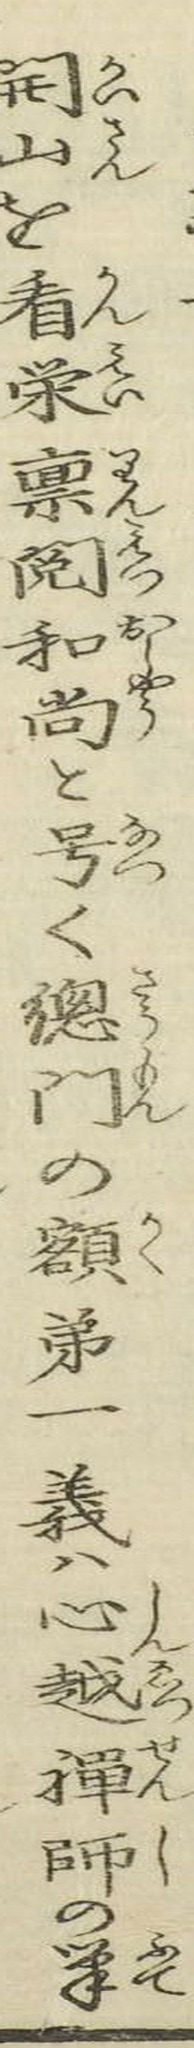開山を看栄稟閲和尚と号く総門の額第一義は心越禅師の筆
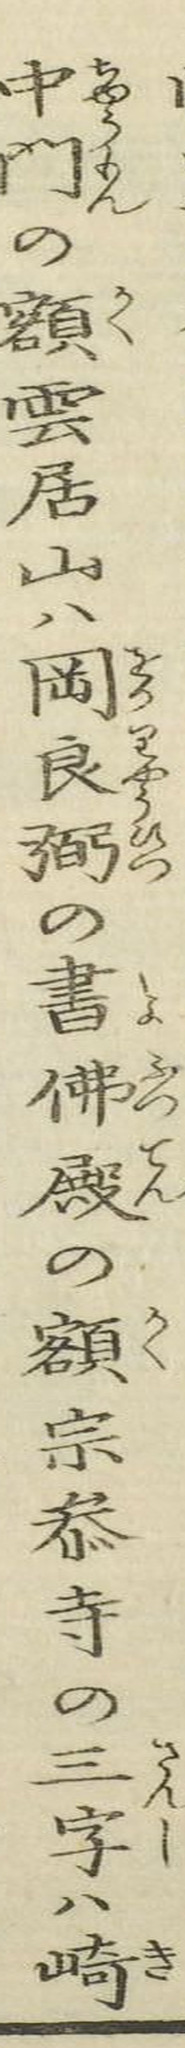中門の額雲居山は岡良弼の書仏殿の額宗参寺の三字は崎
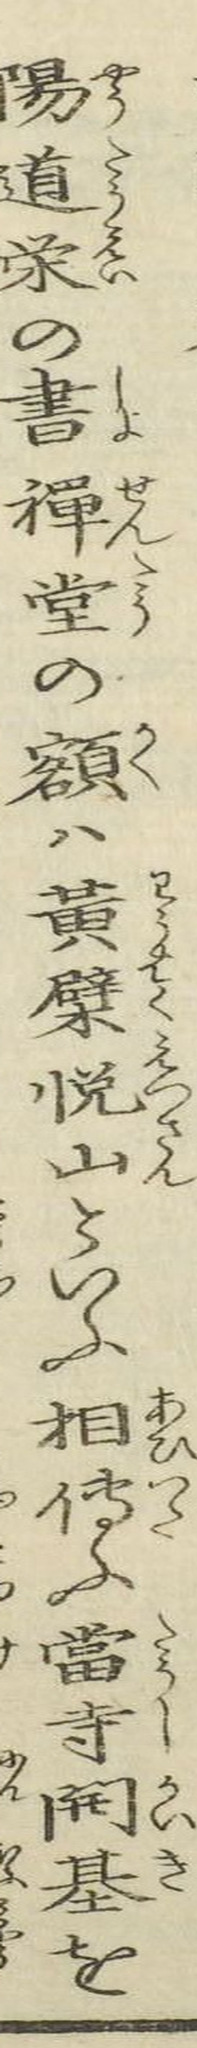陽道栄の書禅堂の額は黄檗悦山といふ相伝ふ当寺開基を
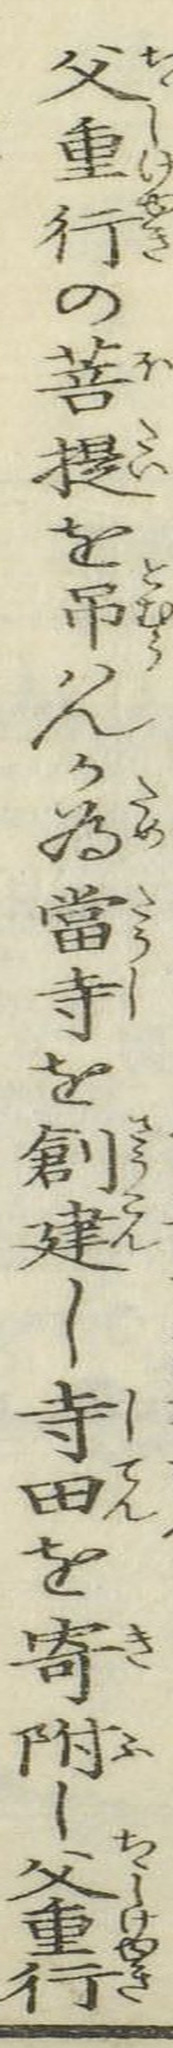父重行の菩提を弔はんか為当寺を創建し寺田を寄附し父重行
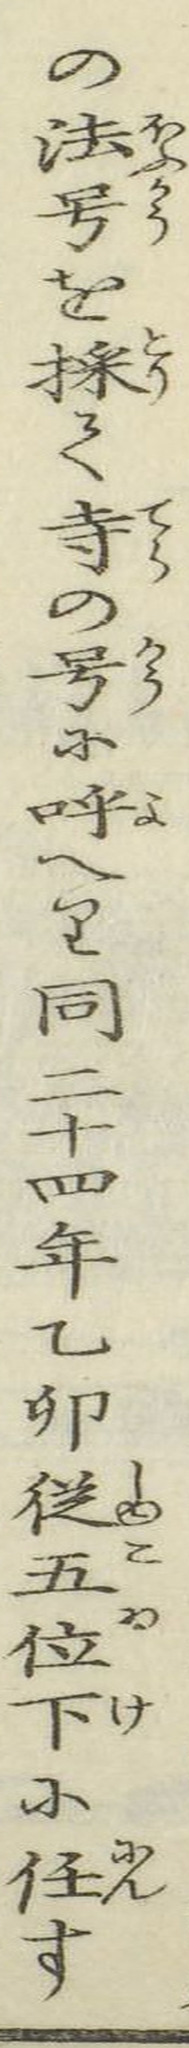の法号を採て寺の号に呼へり同二十四年乙卯従五位下に任す
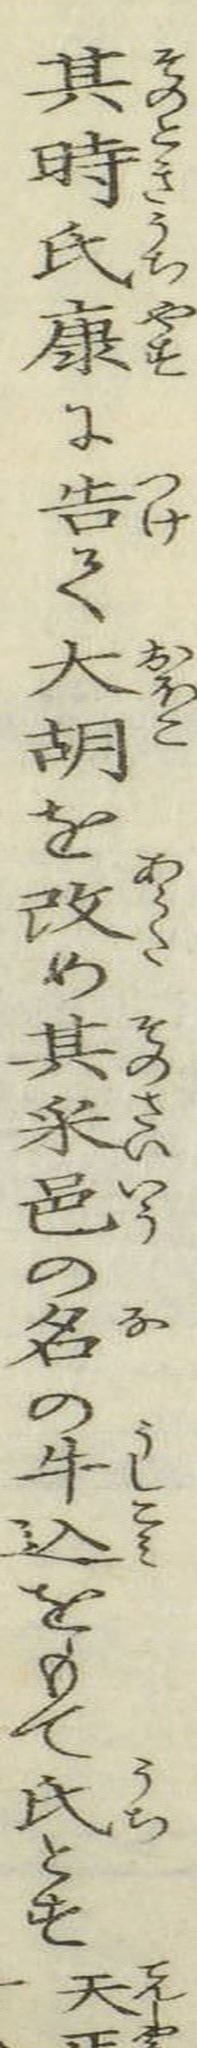其時氏康に告て大胡を改め其采邑の名の牛込をもて氏とす天正十八
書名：江戸名所図会 20巻 巻之11
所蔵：東京学芸大学教育コンテンツアーカイブ
